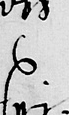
5.)
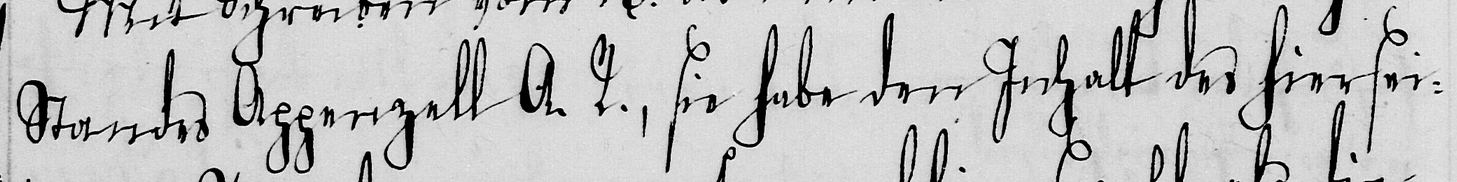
Standes Appenzell A. R., sie habe den Inhalt des hiersei¬
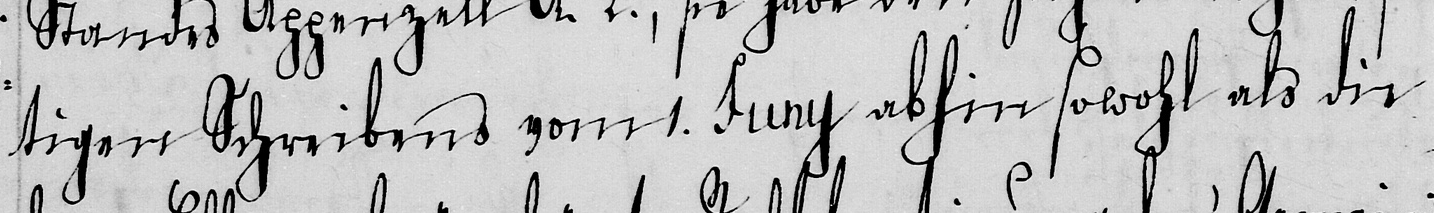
tigen Schreibens vom 1. Juny abhin sowohl als die
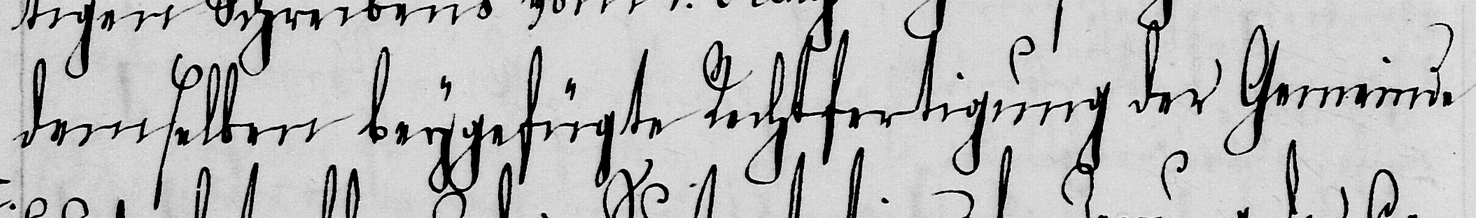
demselben beygefügte Rechtfertigung der Gemeinde
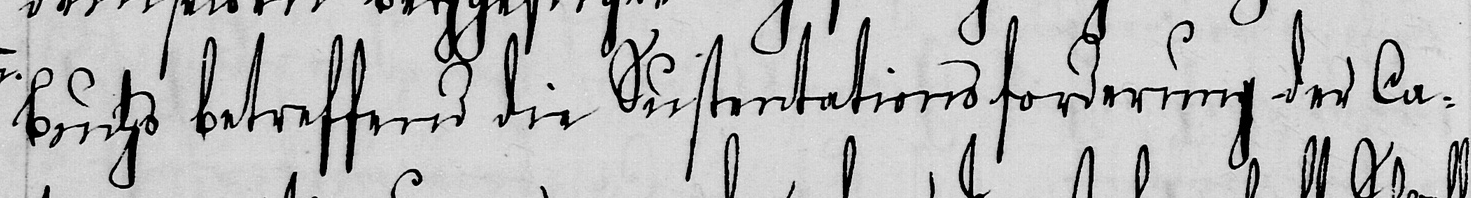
Buchs betreffend die Sustentationsforderung der Ca¬
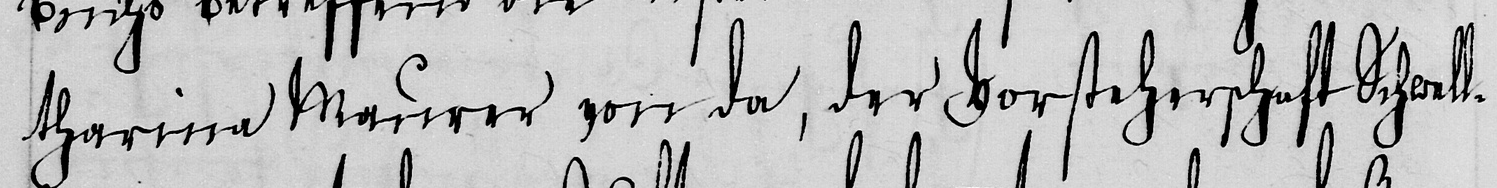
tharina Maurer von da, der Vorsteherschaft Schwel¬
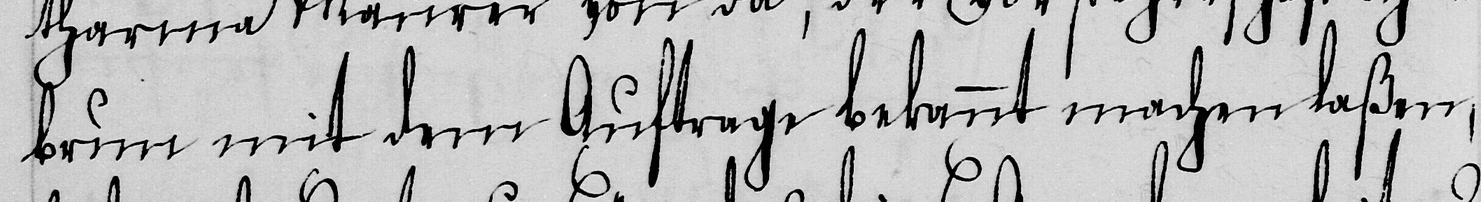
lbrun mit dem Auftrage bekannt machen laßen,
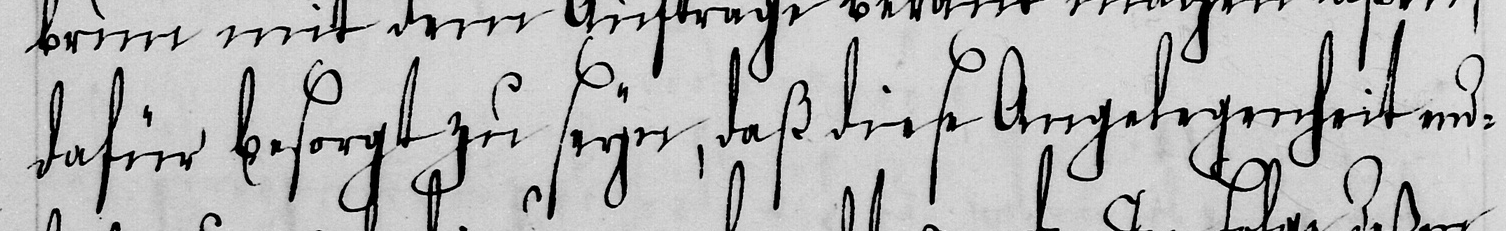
dafür besorgt zu seyn, daß diese Angelegenheit en¬
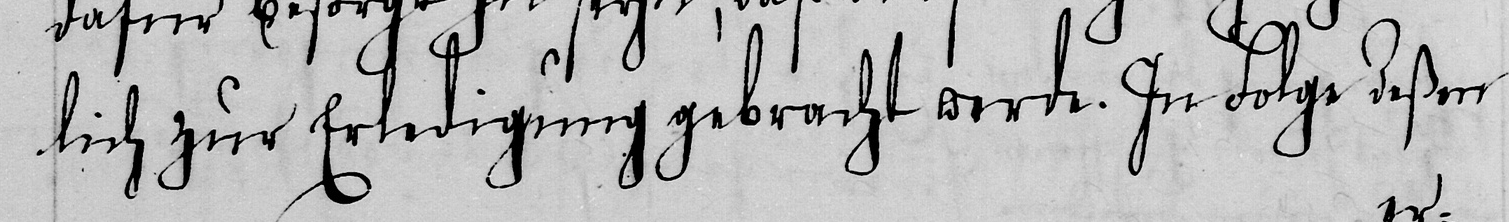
dlich zur Erledigung gebracht werde. In Folge deßen
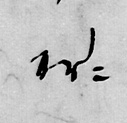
er
